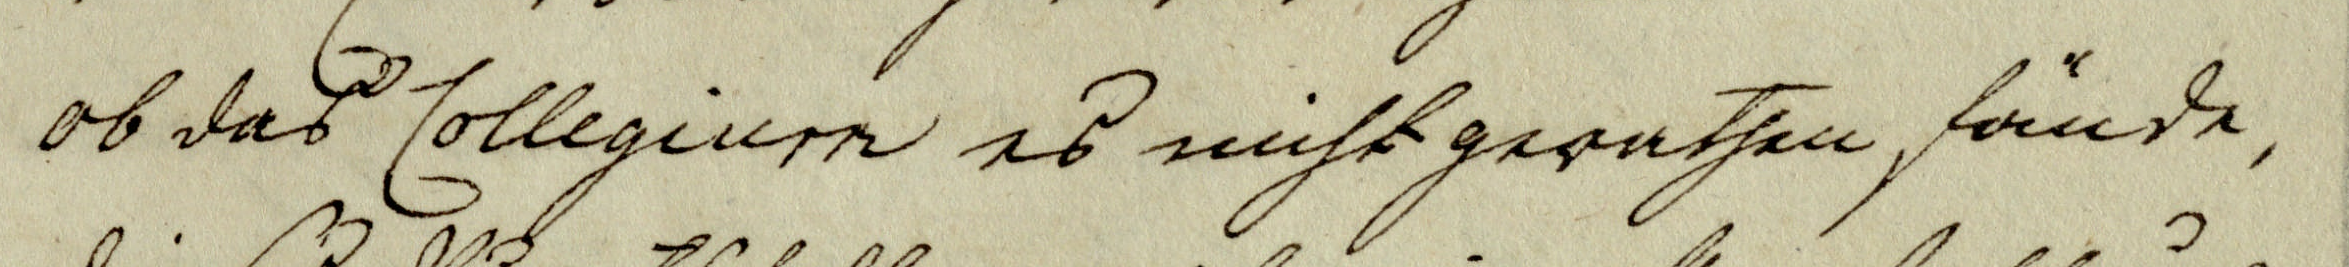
ob das Collegium es nicht gerathen fände,
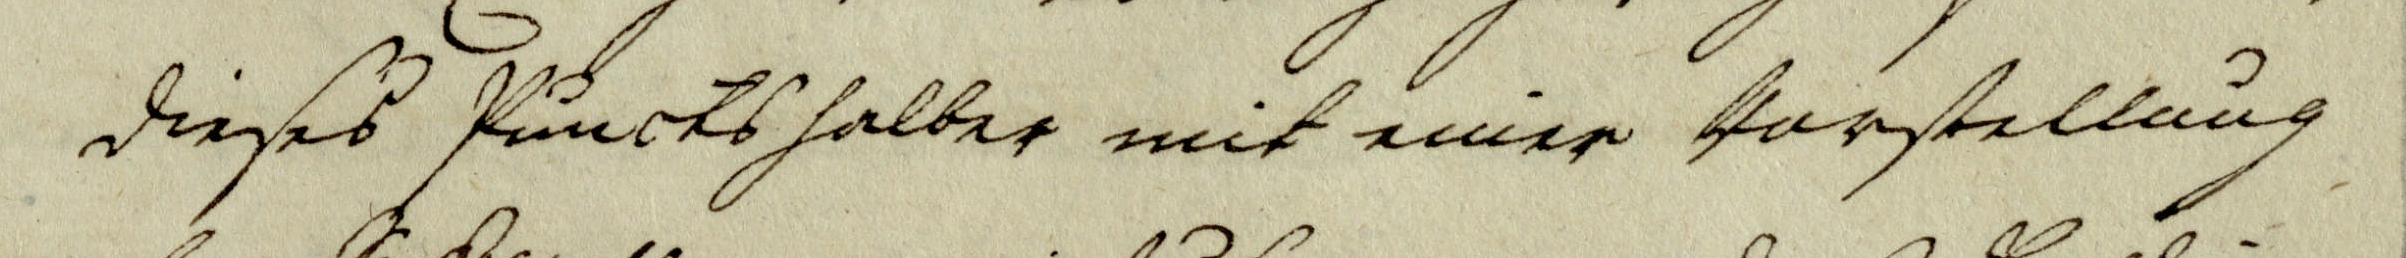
dieses Puncts halber mit einer Vorstellung
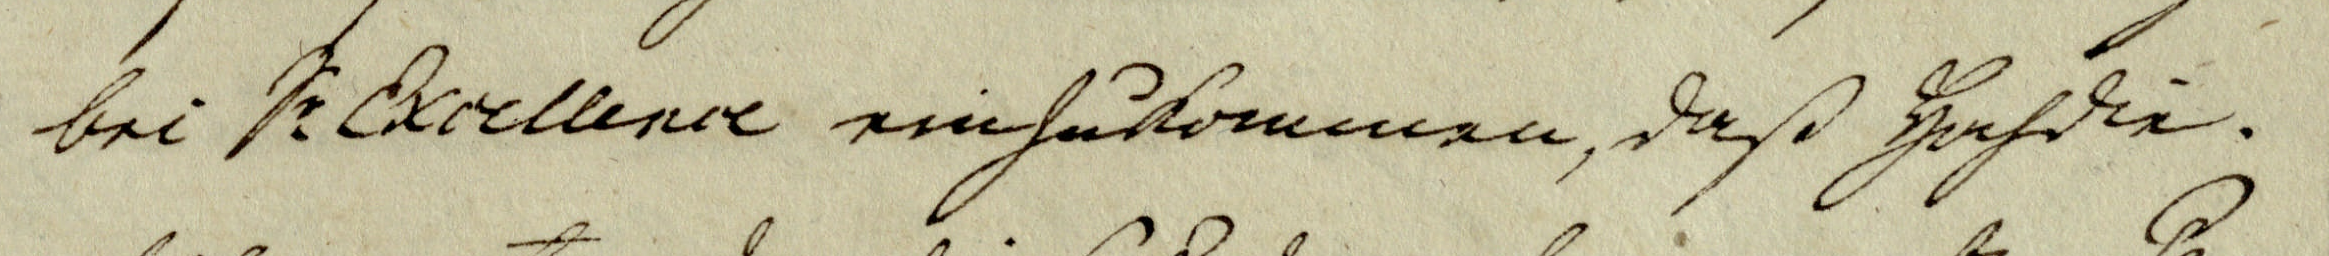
bei Sr Excellence einzukommen, daß Hochdie¬
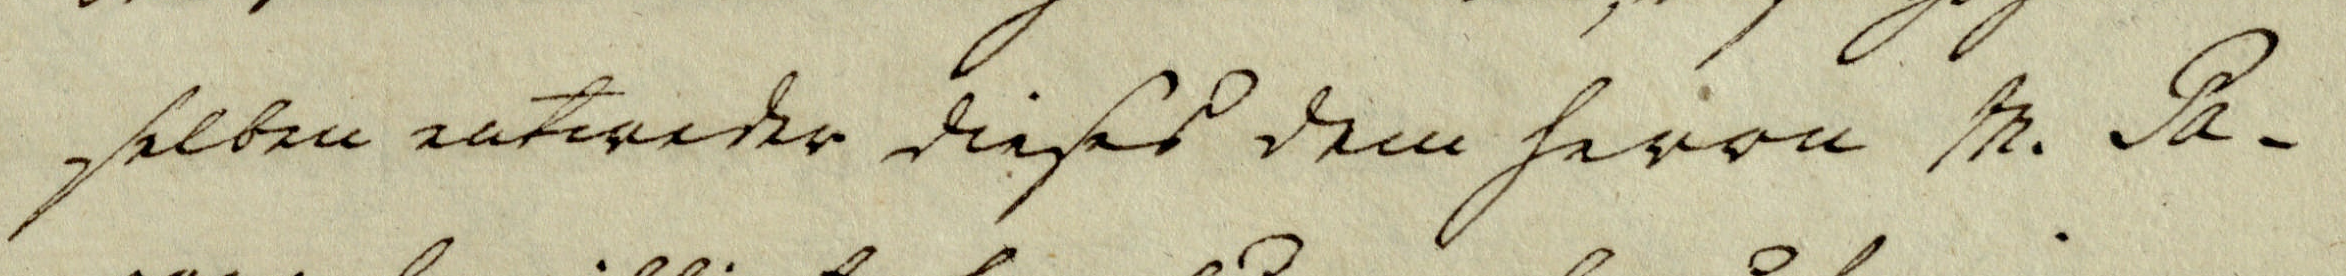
selben entweder dieses dem Herrn M. Pa¬
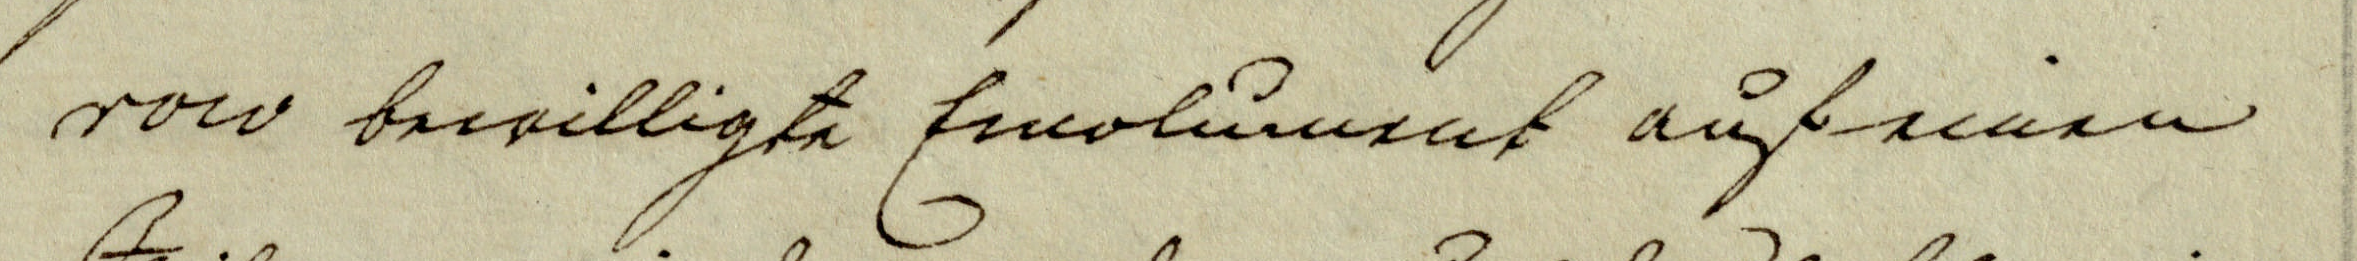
row bewilligte Emolument auf einen
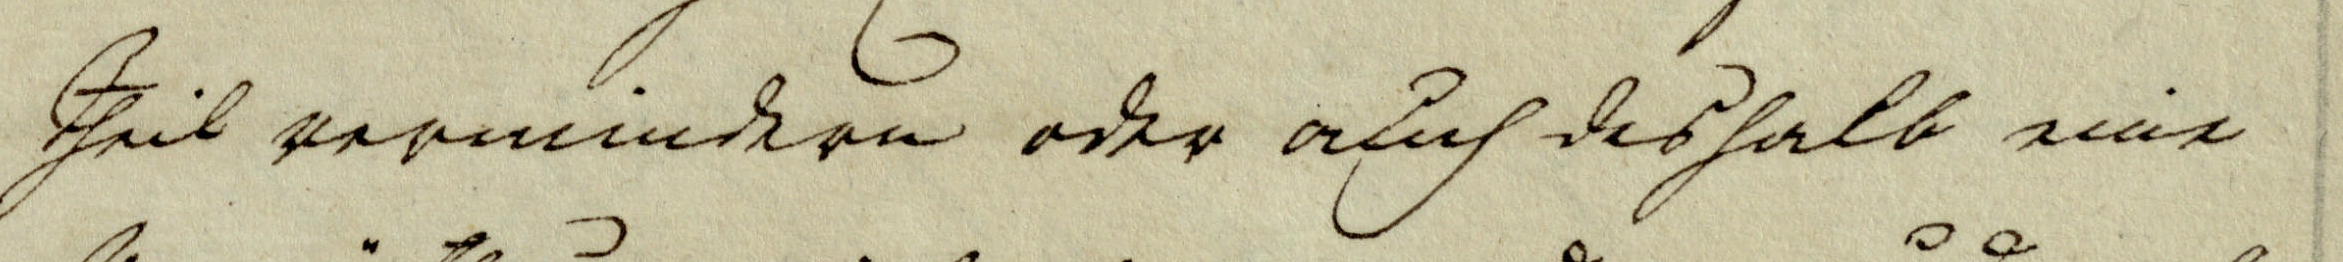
Theil vermindern oder auch deshalb eine
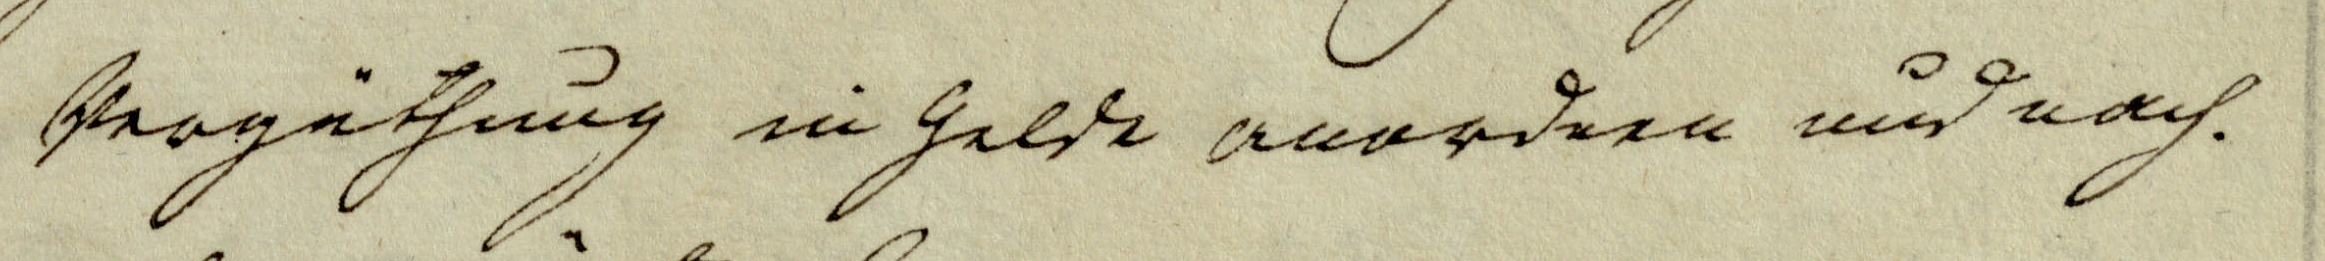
Vergüthung in Gelde anordnen und nach¬
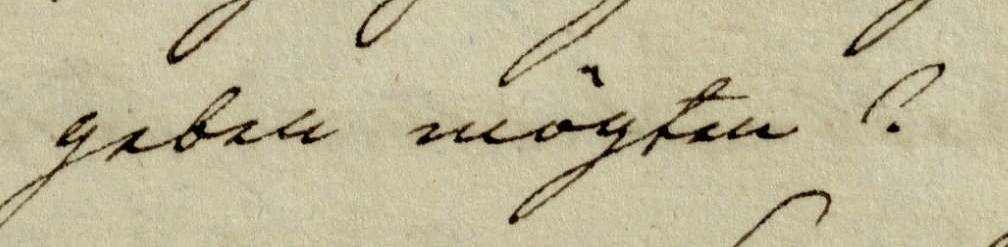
geben mögten?
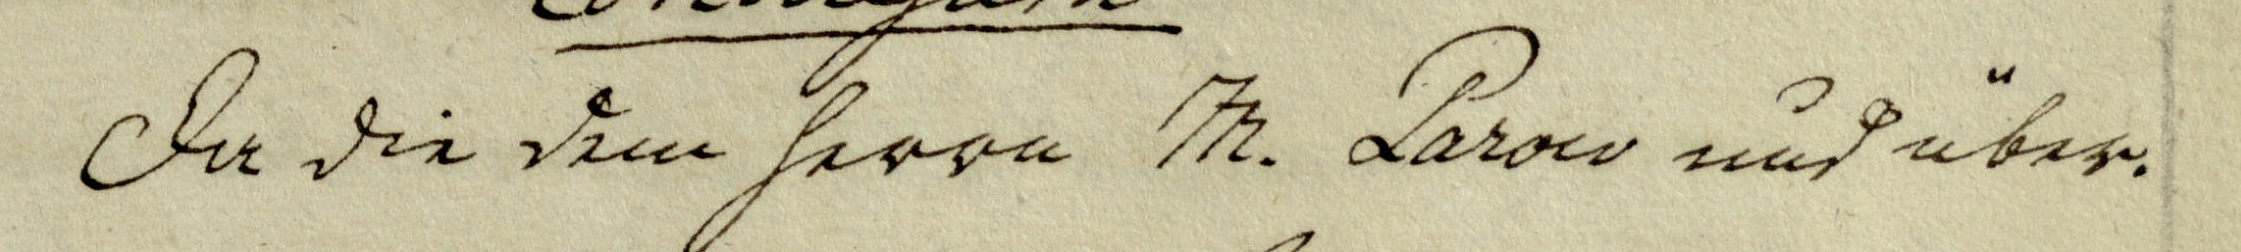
Da die dem Herrn M. Parow und über¬
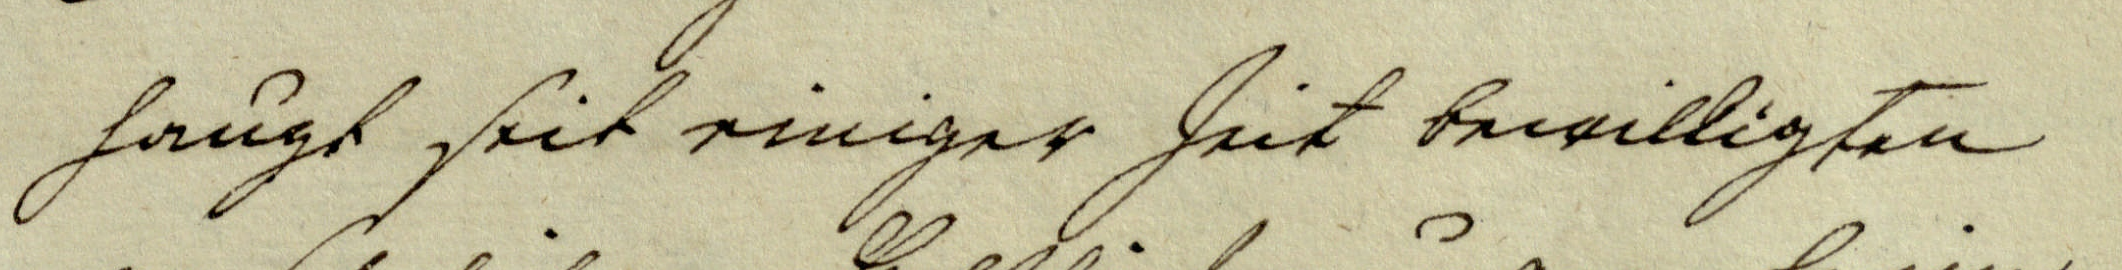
haupt seit einiger Zeit bewilligten
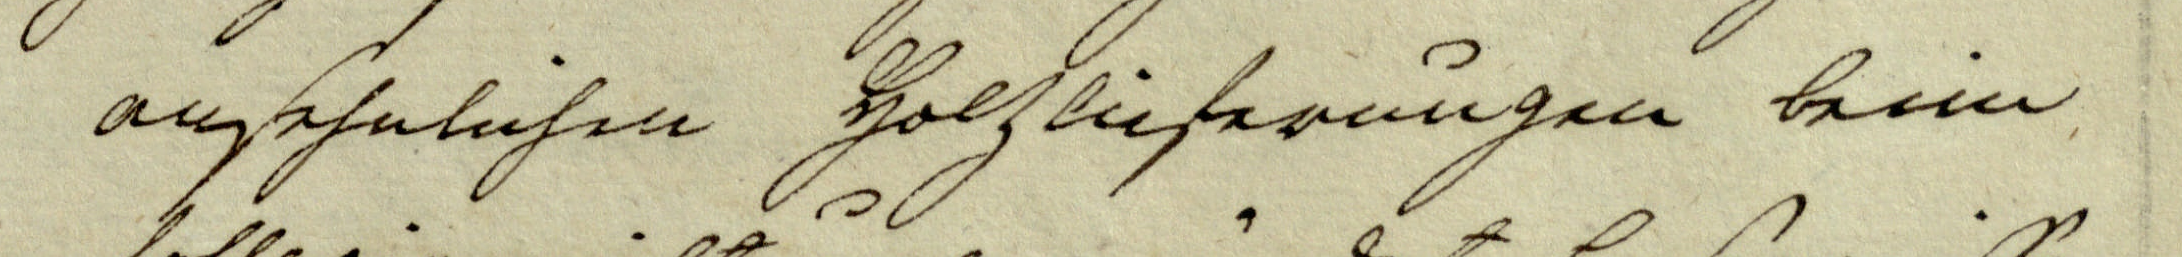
ansehnlichen Holzlieferungen beim
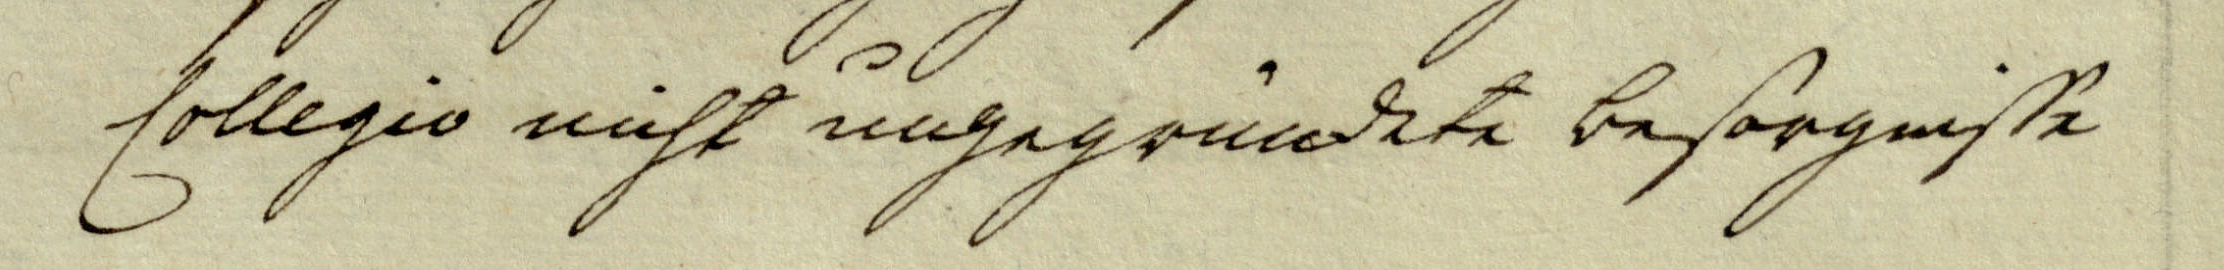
Collegio nicht ungegründete Besorgisse
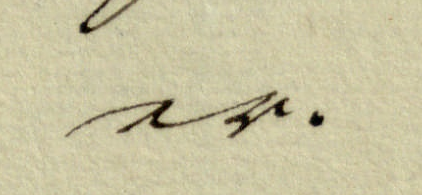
er¬
